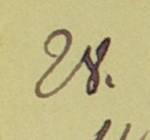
28
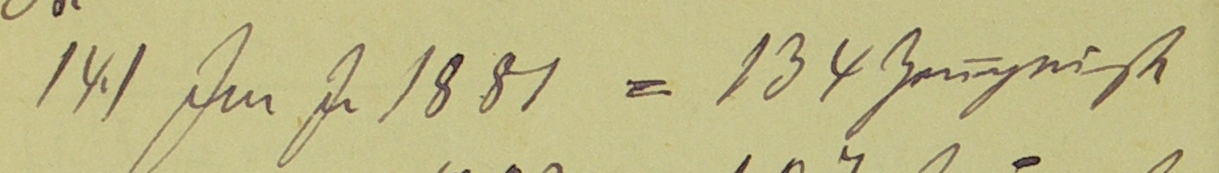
14) 1881 = 134 *
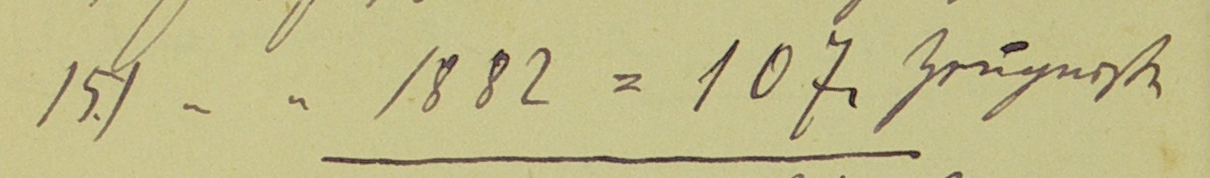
15) 1882 = 107 *
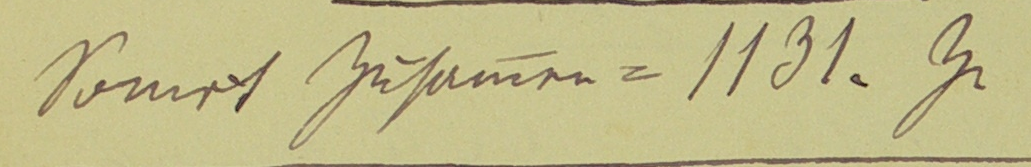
Somit zusammen = 1131 Zeugniße
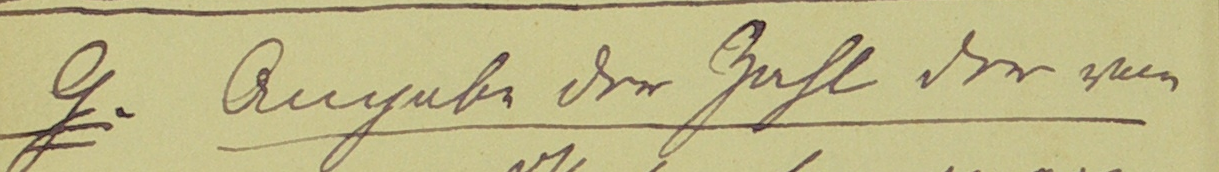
G.) Angabe der Zahl der von
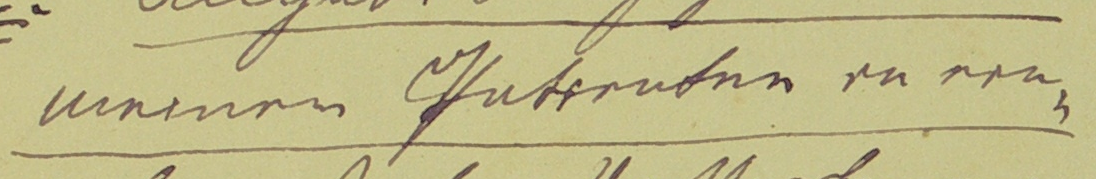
meinen Patienten in ein¬
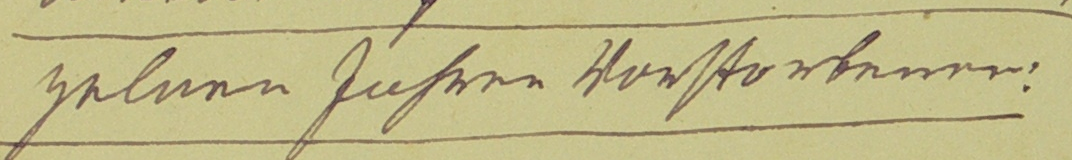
zelnen Jahren Verstorbenen:
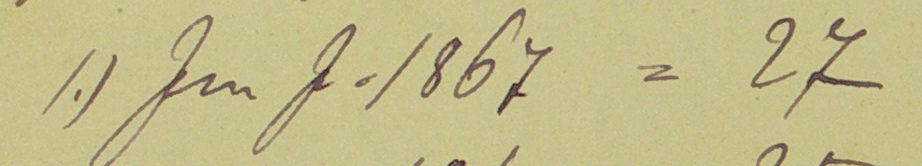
1) Im Jahre 1867 = 27 Personen
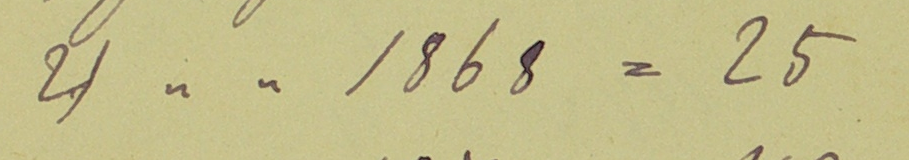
2) * 1868 = 25
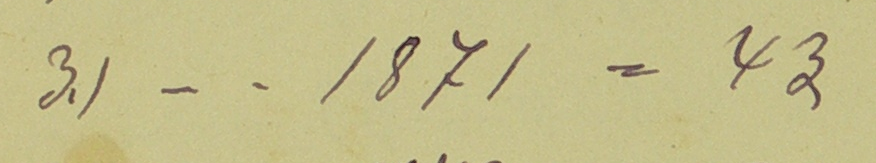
3) * 1871 = 43
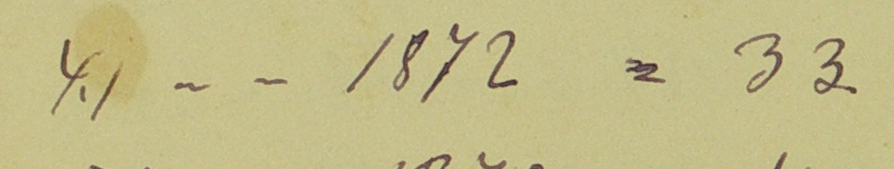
4) * 1872 = 33
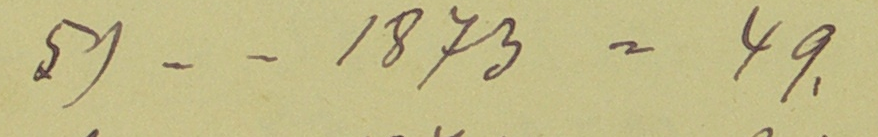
5) * 1873 = 49
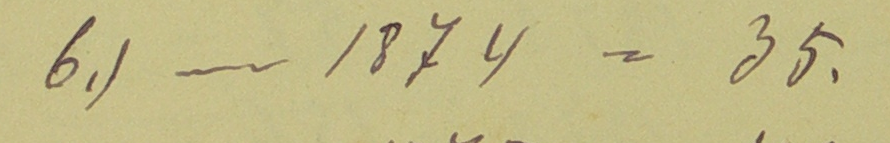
6) * 1874 = 35
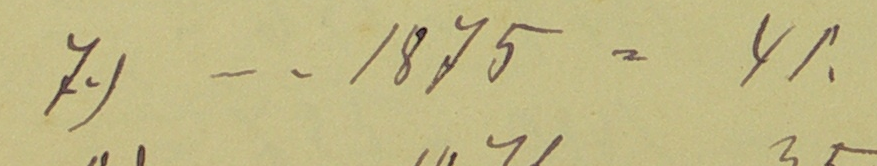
7) * 1875 = 41
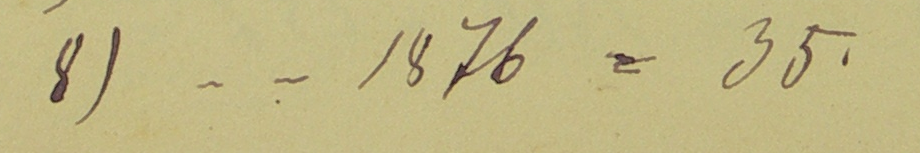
8) * 1876 = 35
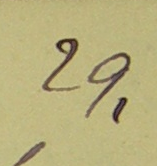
29
